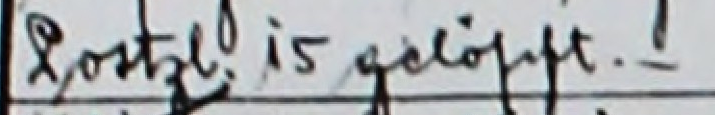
Postzl. 15 gelöscht.-
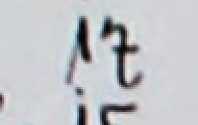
17
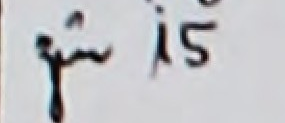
zu 15
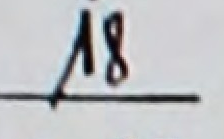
18
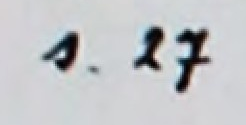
s. 27
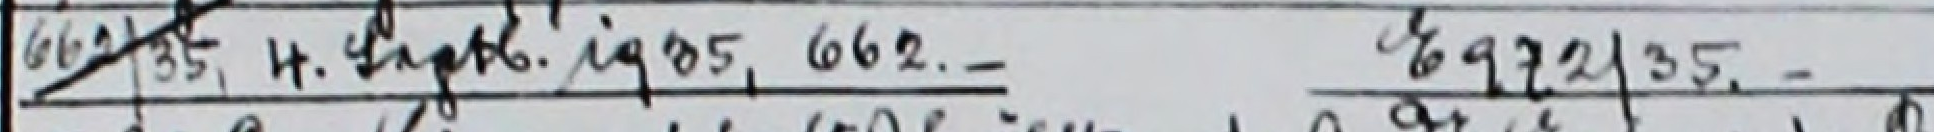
662/35, 4 Septb. 1935, 662.- E 972/35.-
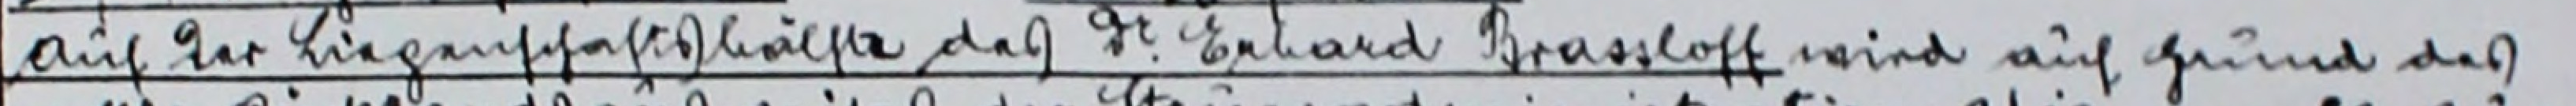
Auf der Liegenschaftshälfte des Dr. Erhard Brassloff wird auf Grund des
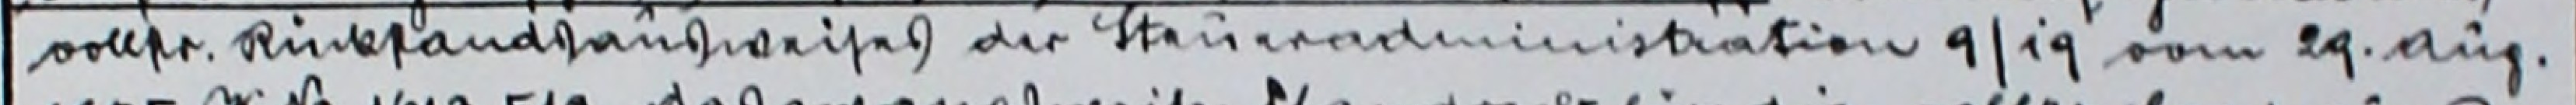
vollstr. Rückstandsausweises der Steueradministration 9/19 vom 29. Aug.
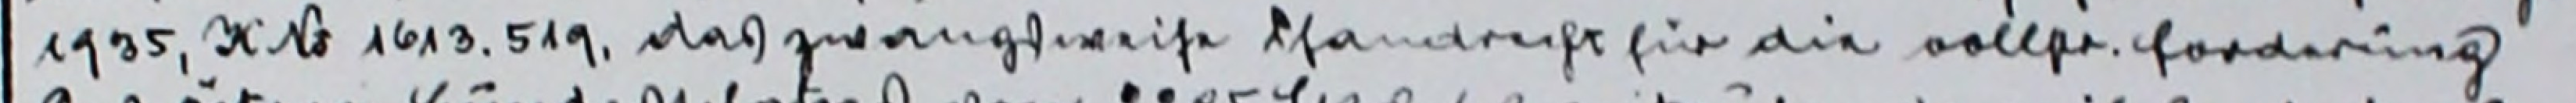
1935, K No 1613. 519, das zwangsweise Pfandrecht für die vollstr. Forderung
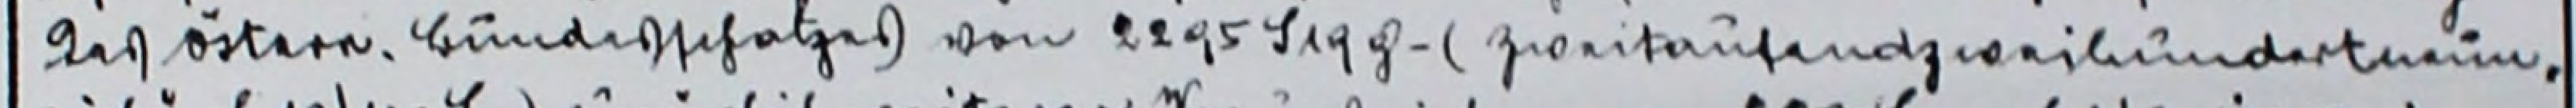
des östern, Bundesschatzes von 2295 S 19 g - (Zweitausendzweihundertneun„
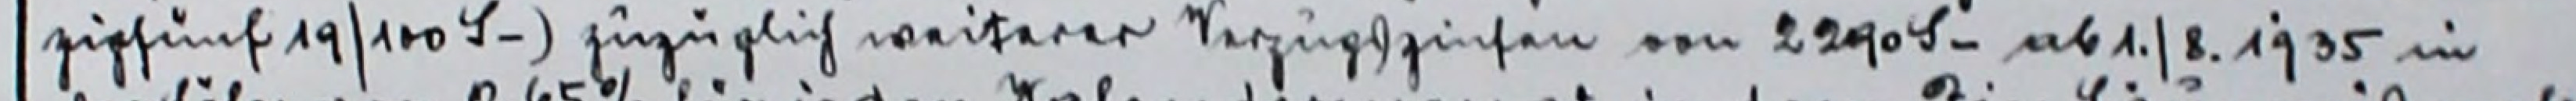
zigfünf 19/100 S-) zuzuglich weiteren Verzugszinsen von 2290 S- ab 1./8. 1935 in
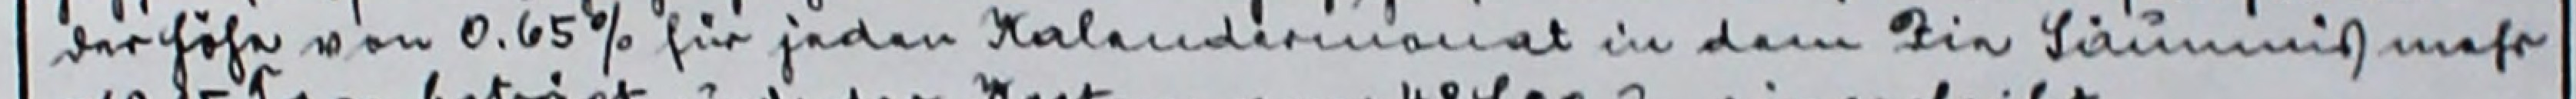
der Höhe von 0.65 % für jeden Kalendermonat in dem die Säumnis mehr
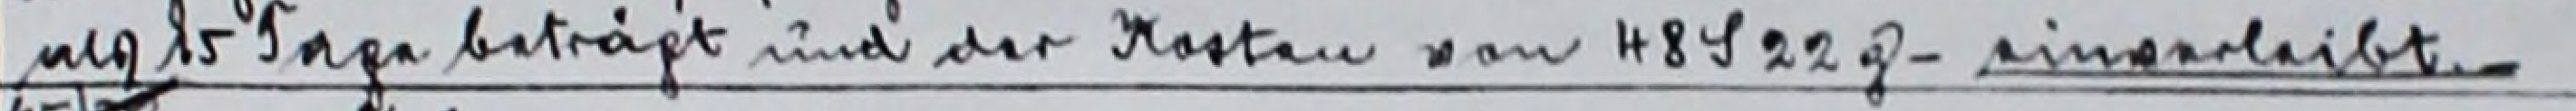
als 15 Tage beträgt und der Kosten von 48 S 22 g - einverleibt.
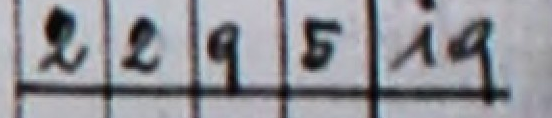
229519
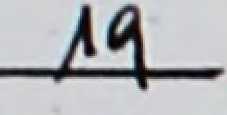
19
